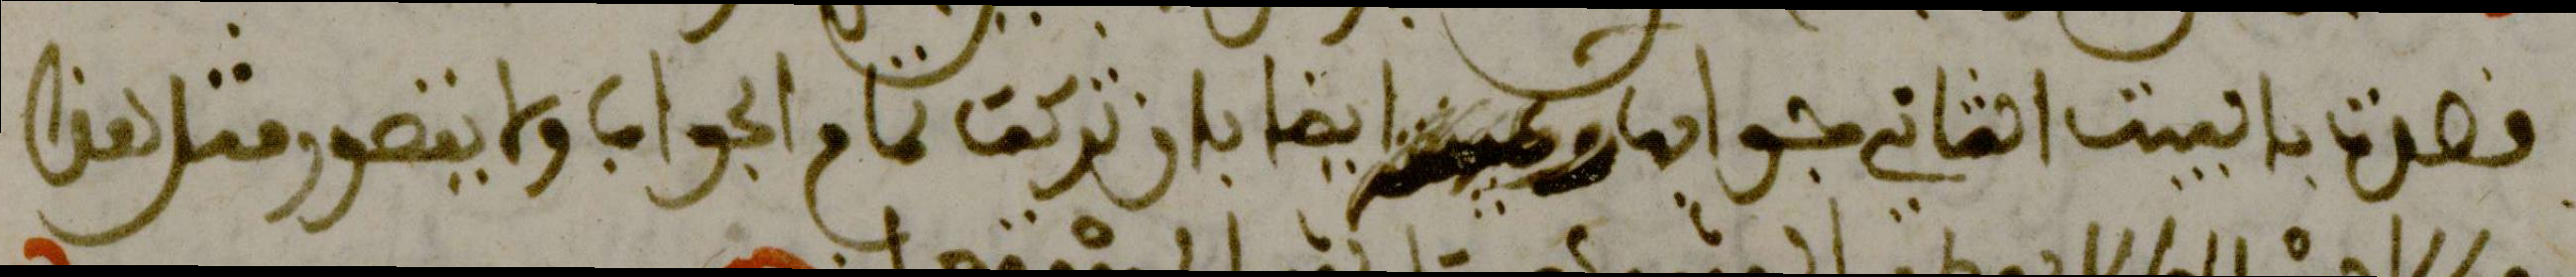فصدت بالبيت الثاني جوابها و# ايضا بان تركت تمام الجواب ولا يتصور مثل هذا
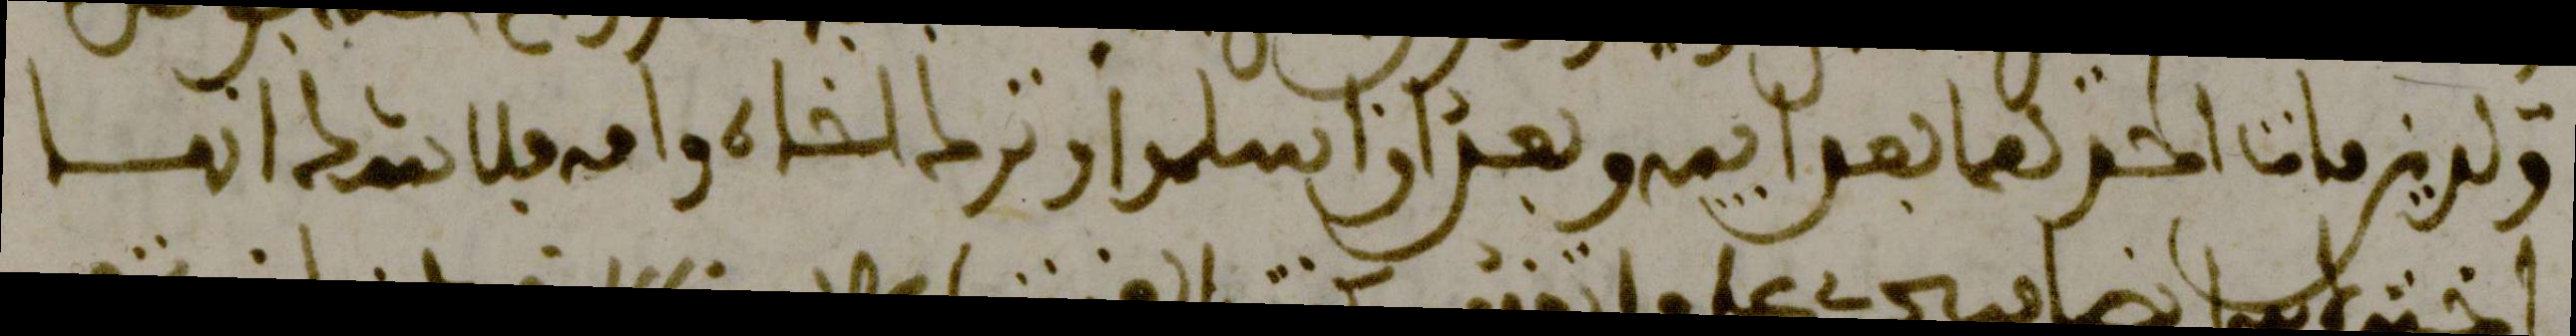ولدين مات احدهما بعد ابيه وبعد ان اسلموا وترك اخاه وامه فلا شك انها
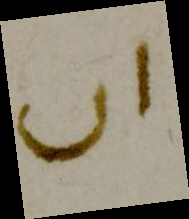ان
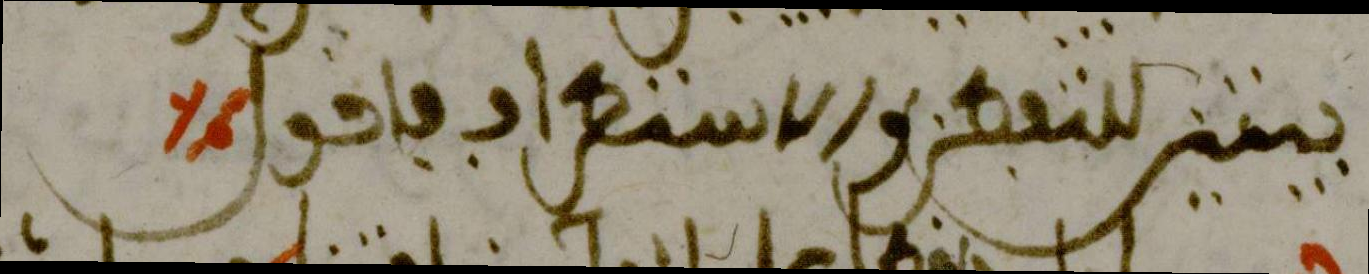بيتين للتقطن والاستطراف فاقول
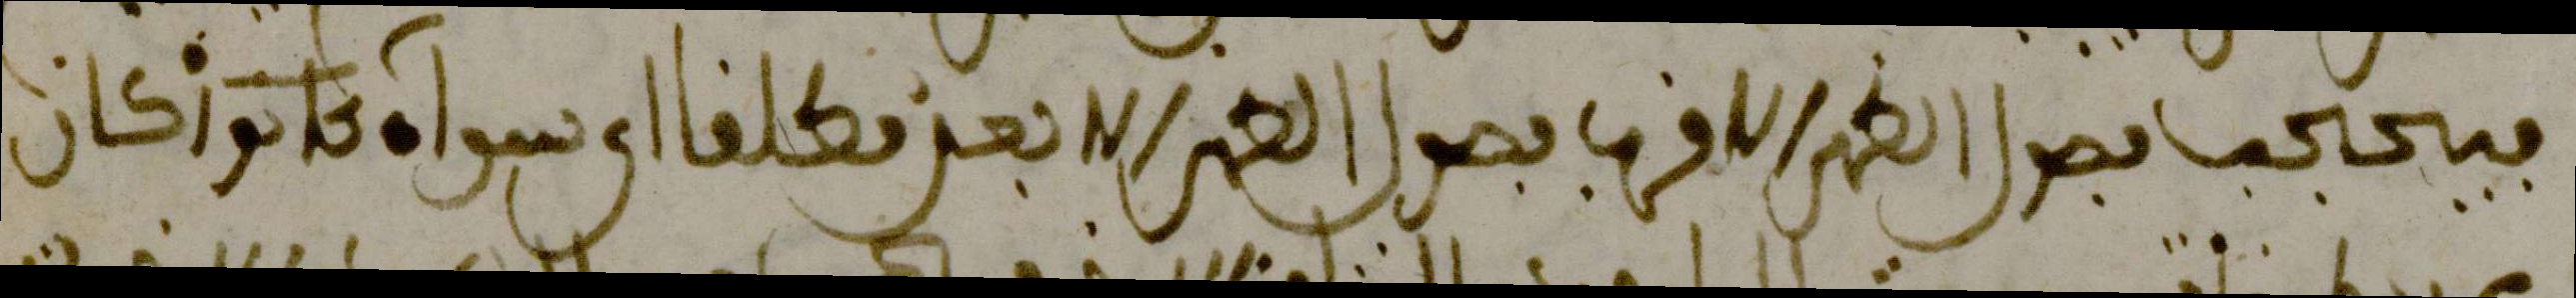فيحجب فصول الظهر الاقرب فصول الظهر الابعد مطلقا اي سواء كانوا كان
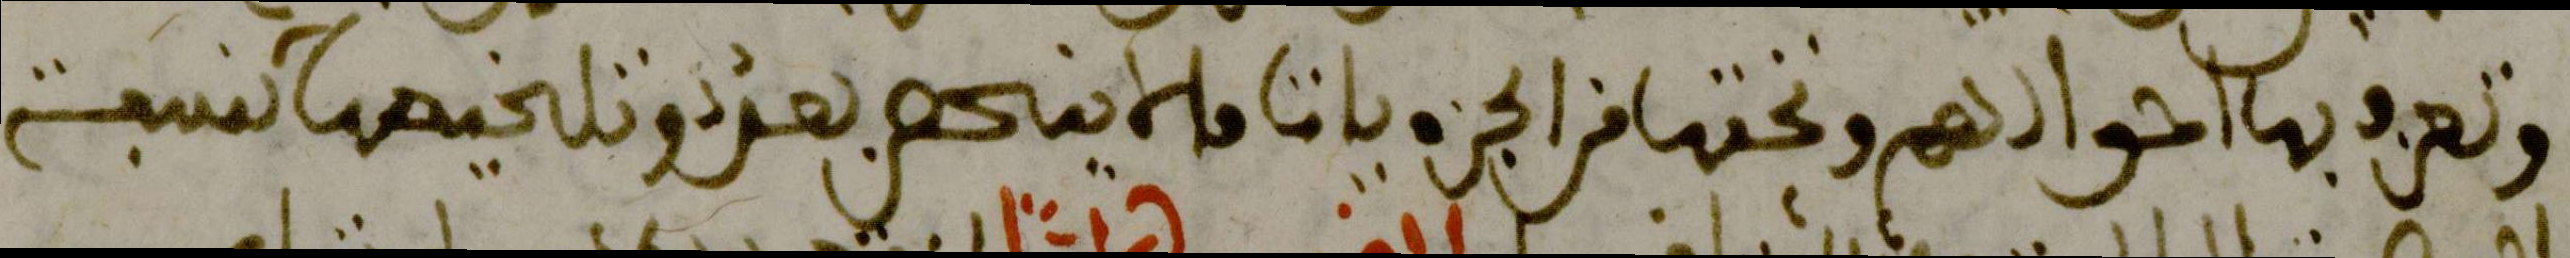وتعرف بها احوالهم وتحتها من الجزءيات ما لا ينحصر بعدد وتلخيصها نسبة
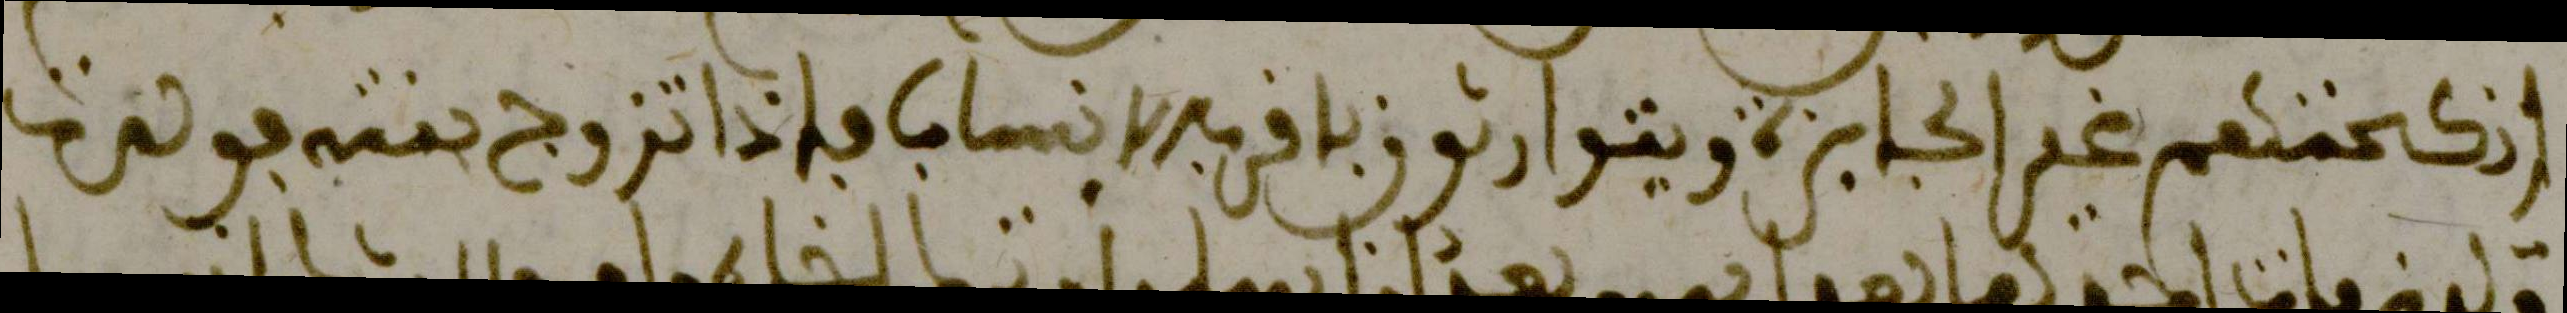انكحتهم غير الجائزة ويتوارثون باقرب الانساب فاذا تزوج بنته فولدت
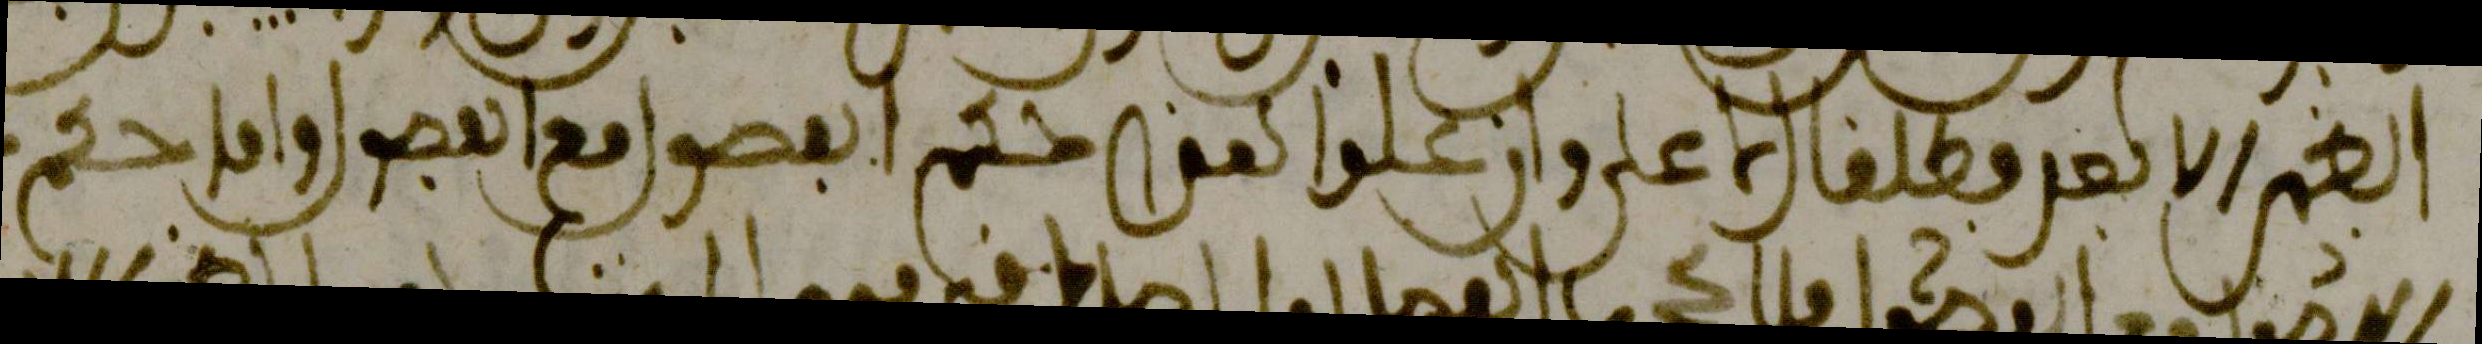الظهر الابعد مطلقا الاعلى وان علوا هذا حكم الفصول مع الفصول واما حكم
